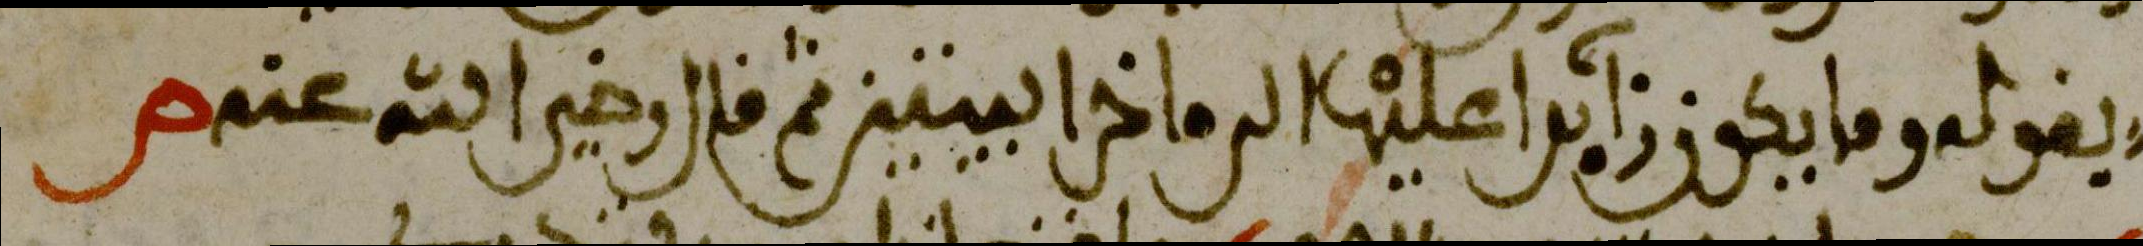يقوله وما يكون زائدا عليها الى ءاخر البيتين ثم قال رضي الله عنه ص
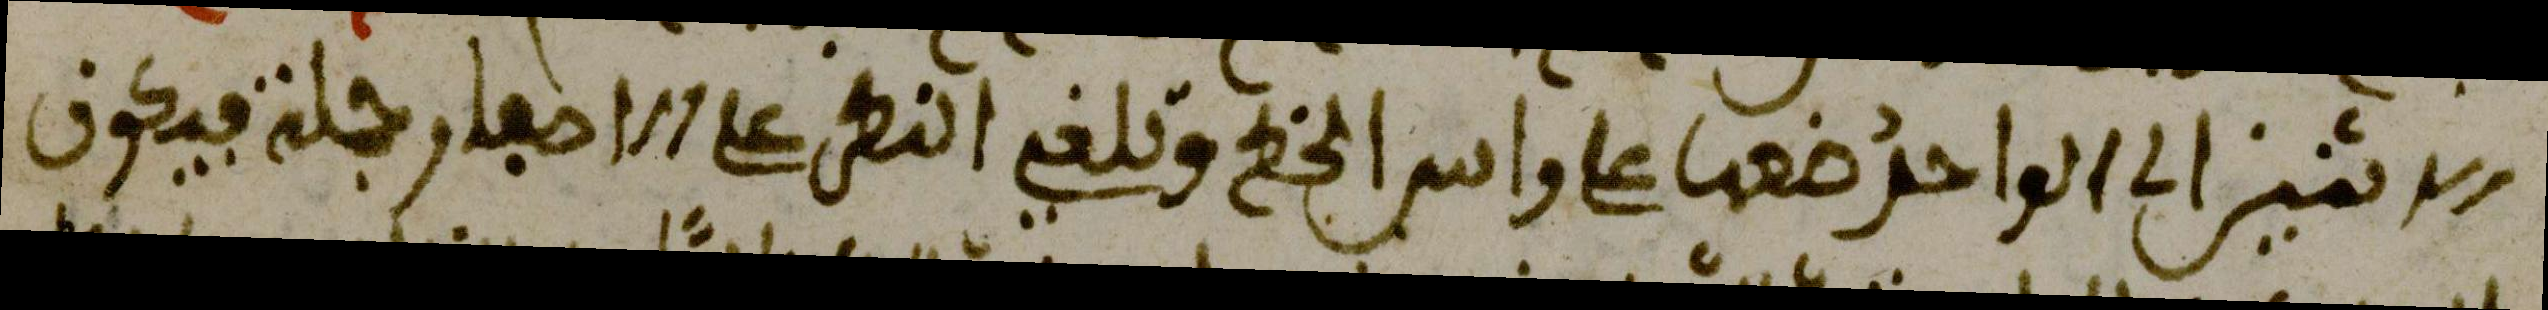الاثنين الى الواحد ضعها على راس الخط رتلغى النظر على الاصفار جملة فيكون
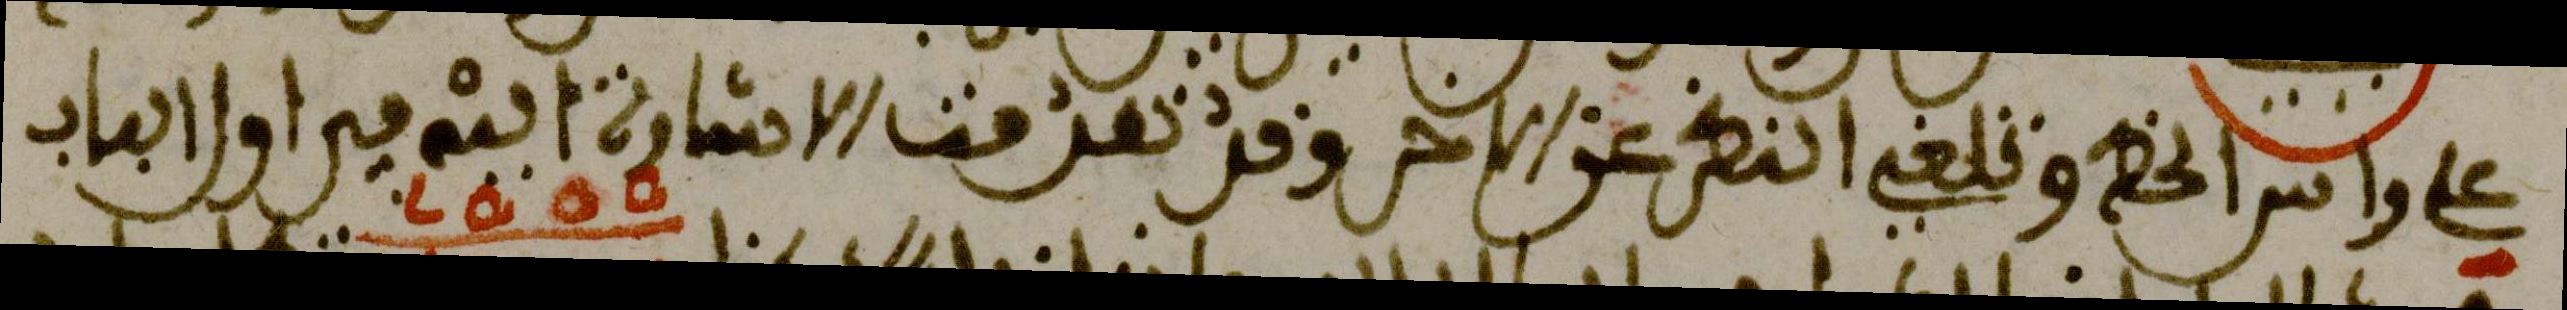على راس الخط وتلغي النظر عن الاخر وقد تقدمت الشارة اليه في اول الباب
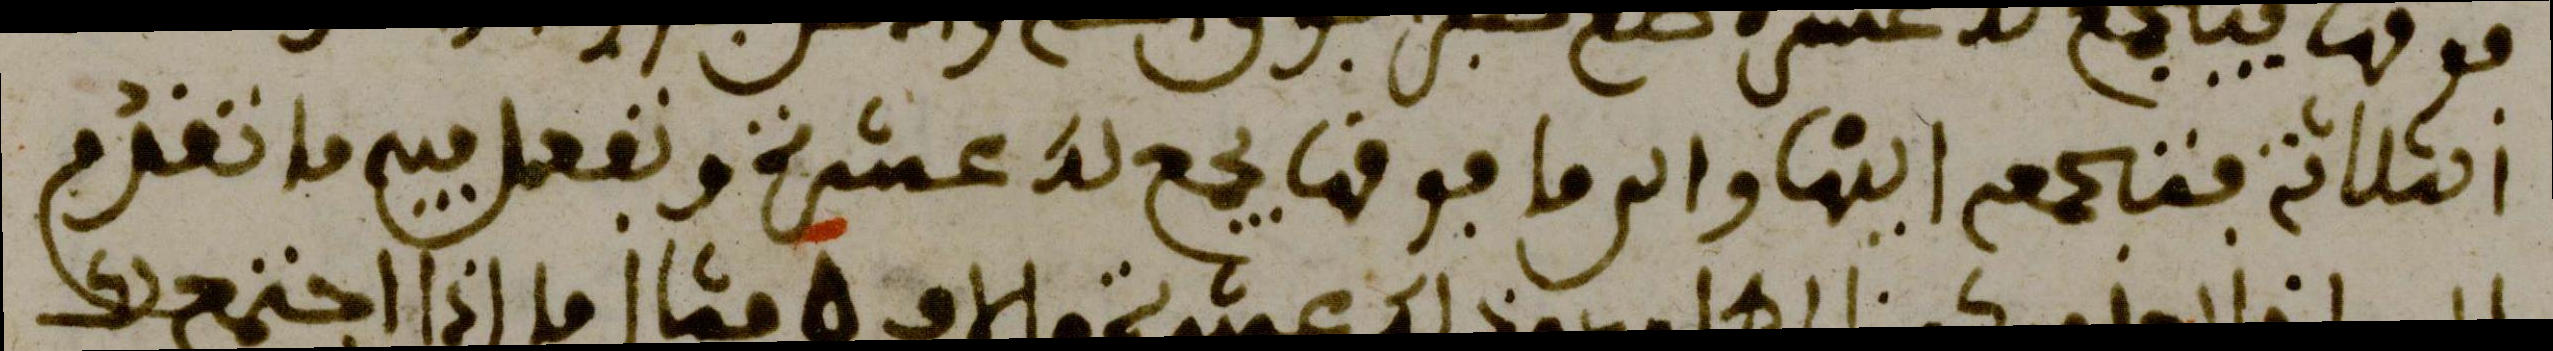الثلاثة فتجمعه اليها والى ما فوقها يجمع لك عشرة وتفعل فيه ما تقدم
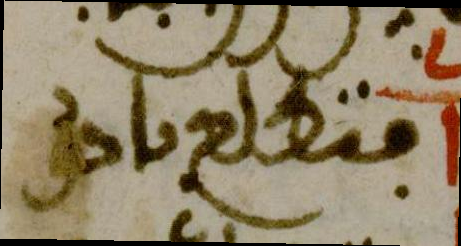فتطلع باحد
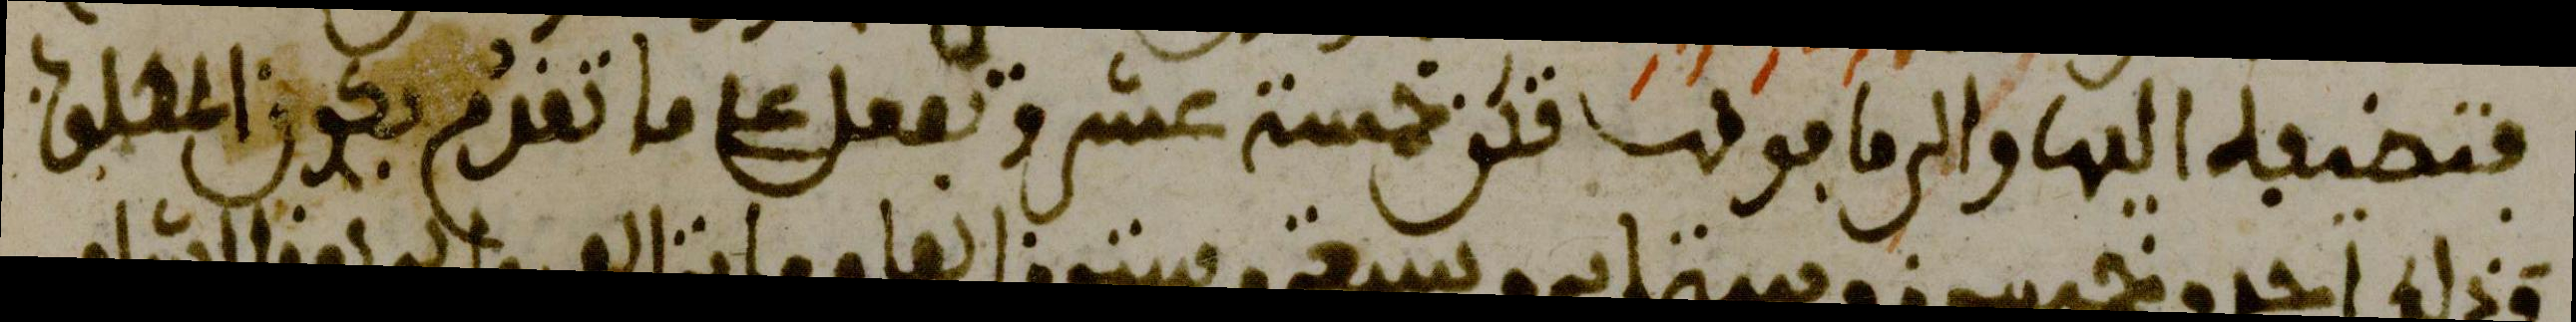فتضيفه اليها والى ما فوقها تكن خمسة عشر وتفعل على ما تقدم يكون المطلوب
